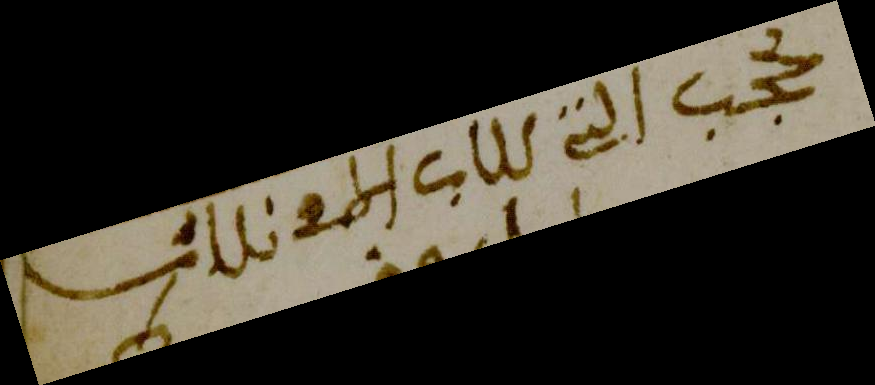تحجب التي للاب الا في ذلك
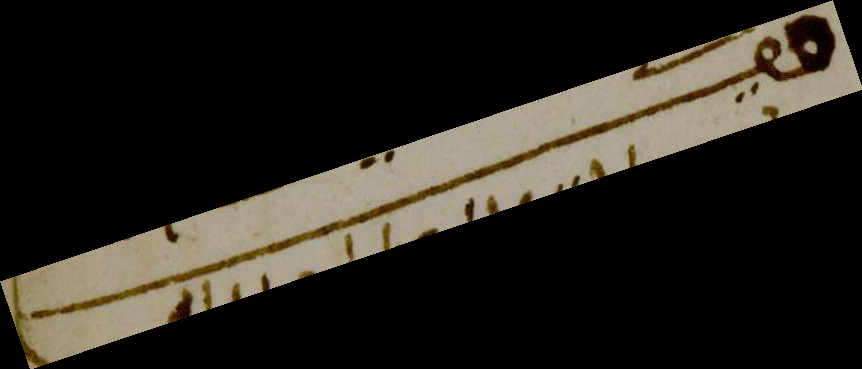قف
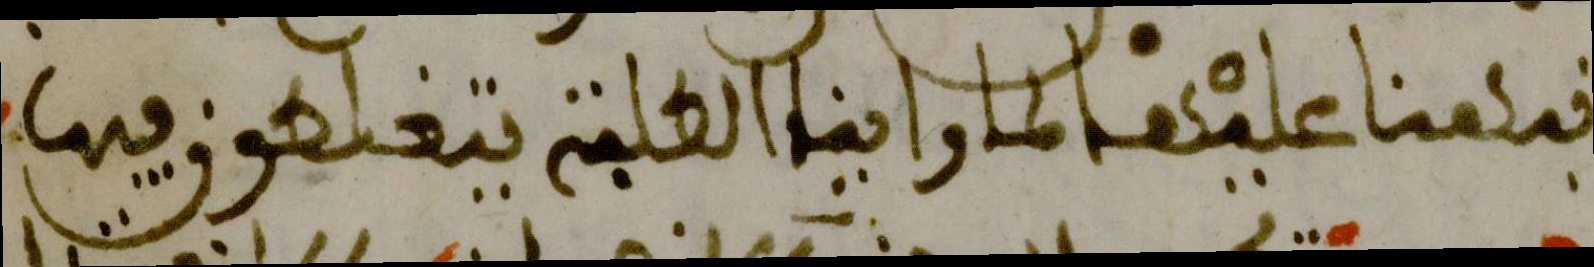نبهنا عليْها لما راينا الطلبة يتغلطون فيها
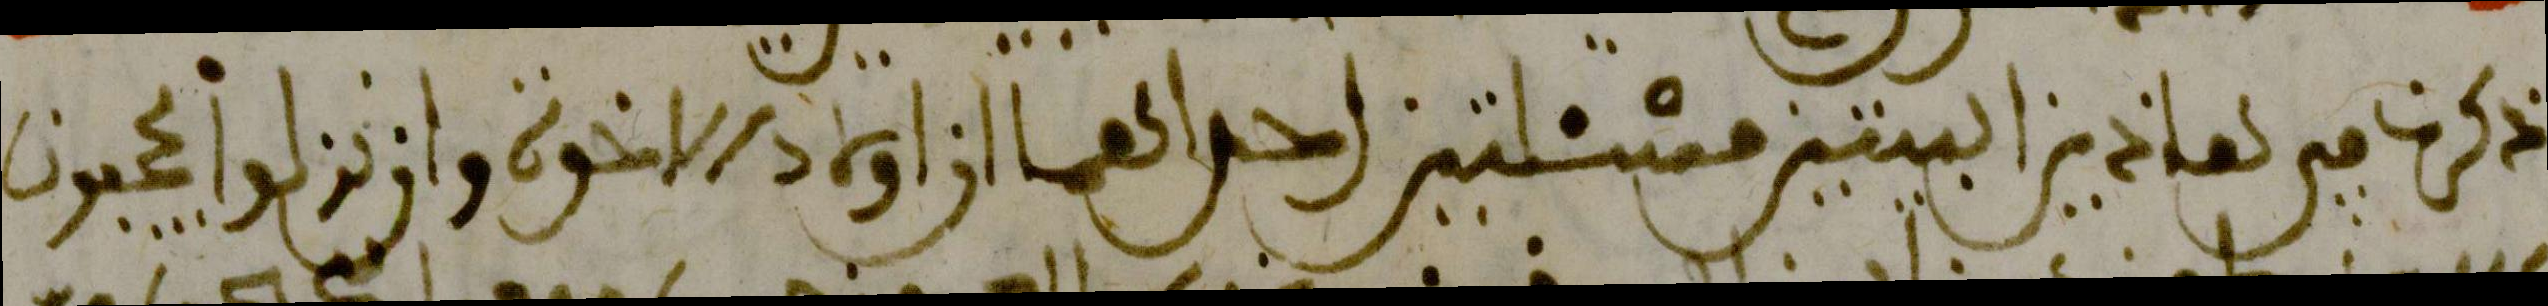ذكرن في هاذين البيتين مسْئلتين احداهما ان اولاد الاخوة وان نزلوا يحجبون
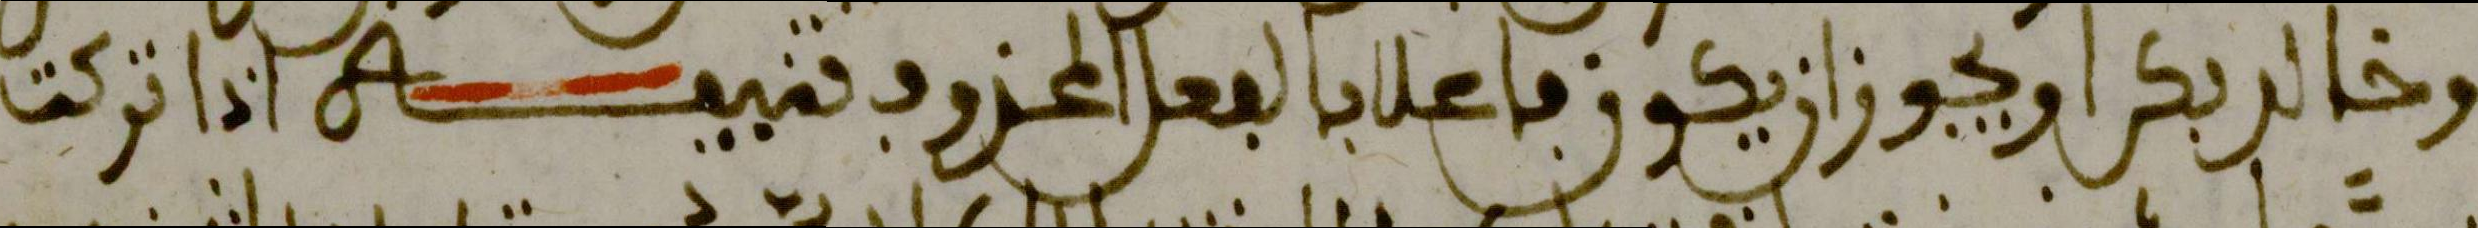وخالد بكر او يجوز ان يكون فاعلا بالفعل المحذوف تنبيه اذا تركت
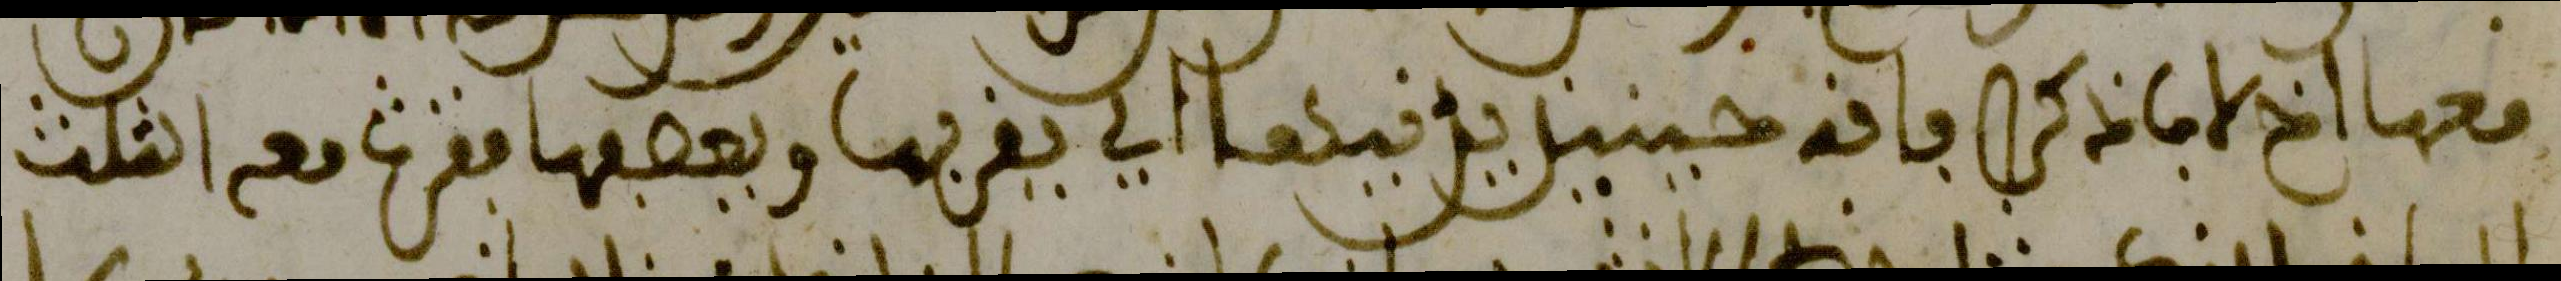معها اخ لاب ذكر فانه حينيذ يدنيها اي يقربها يعصبها فترث معه الثلث
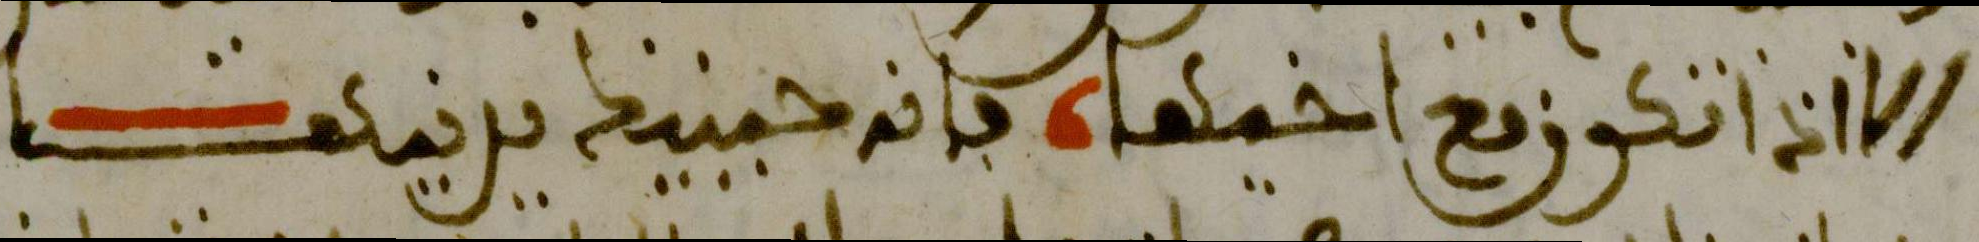الا اذا تكون مع اخيها فانه حينيذ يدنيها
